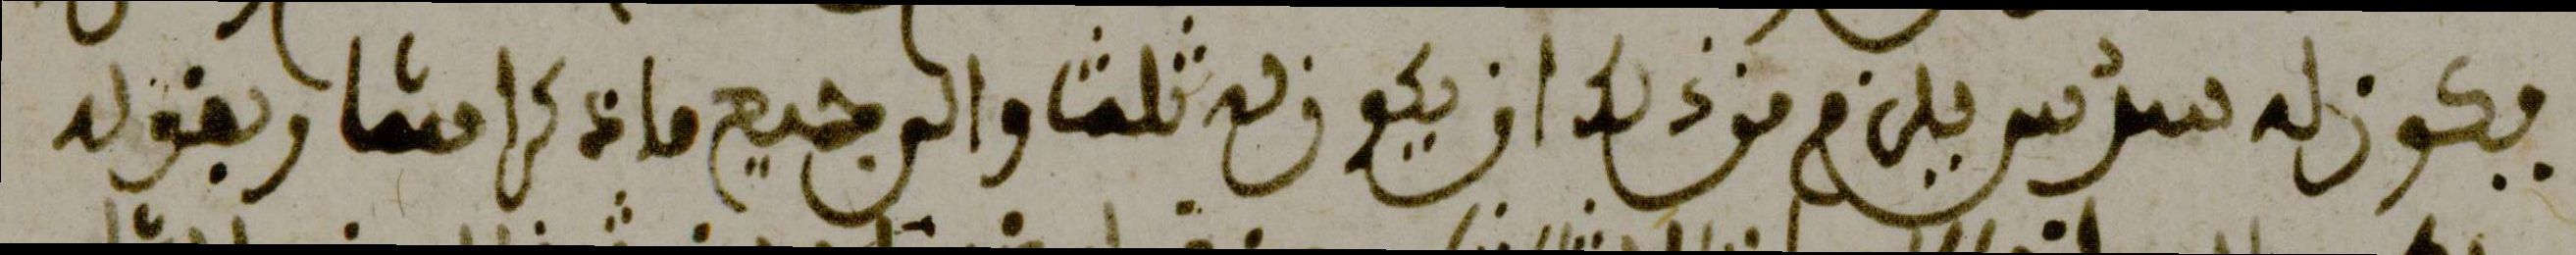يكون له سدس يلزم من ذلك ان يكون له ثلث والى جميع ما ذكر اشار بقوله
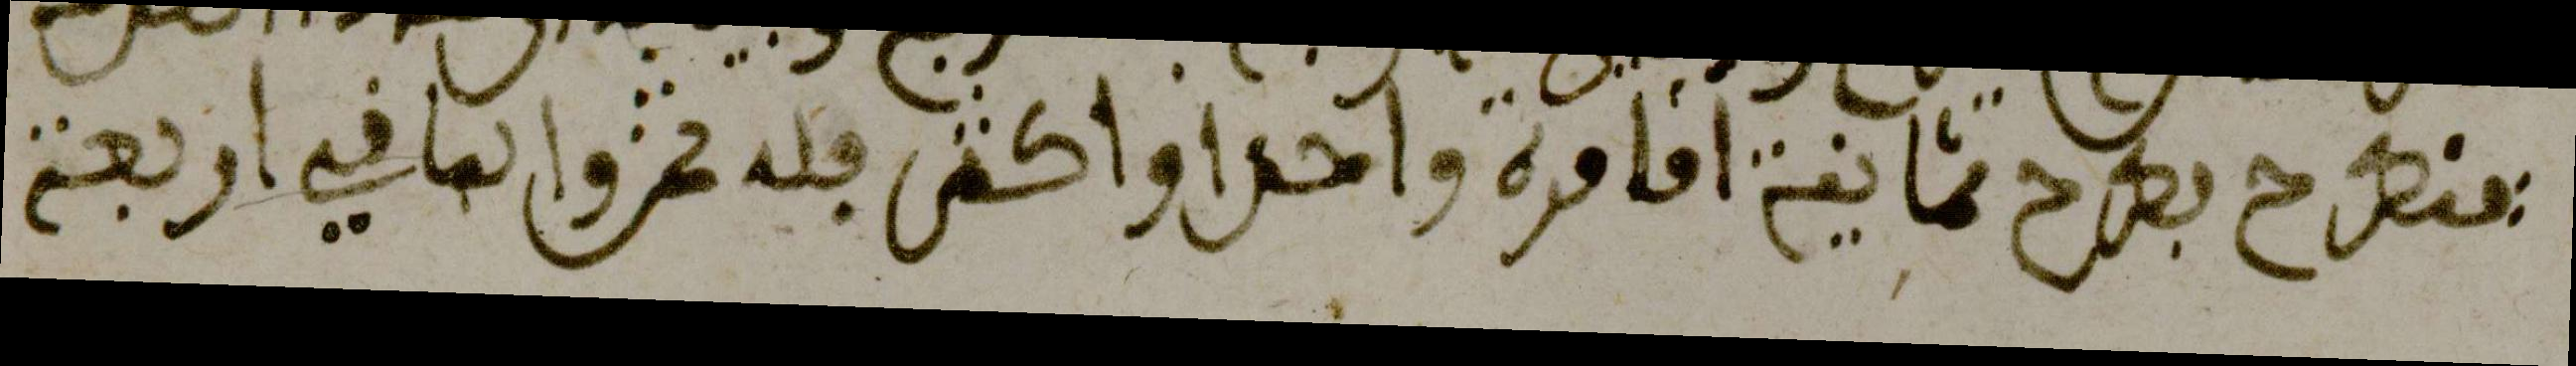منطرح بطرح ثمانية اما مرة واحد او اكثر فله ثمن والباقي اربعة
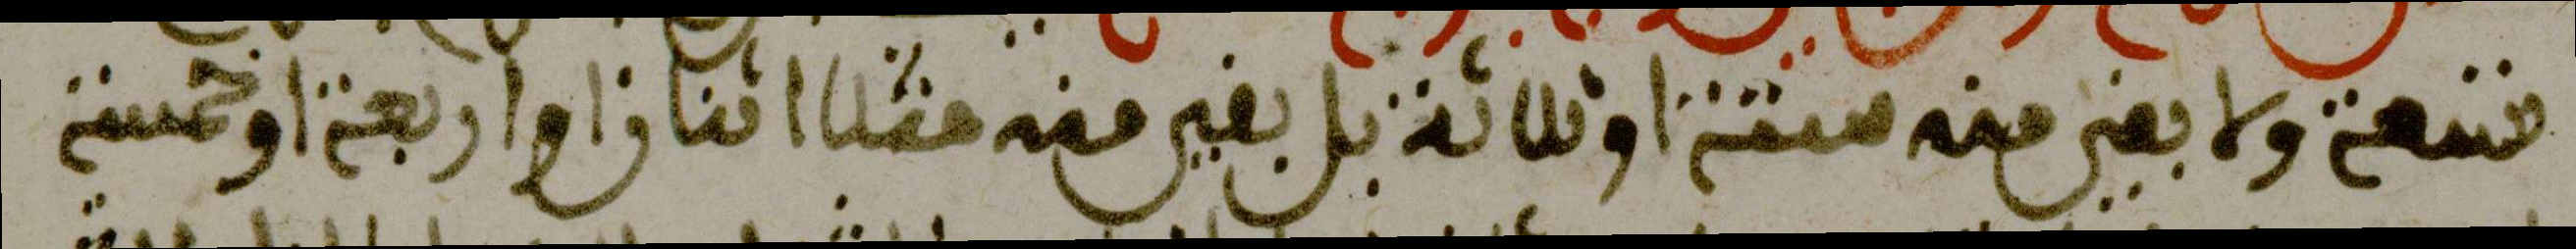تسعة ولا بقي منه ستة او ثلاثة بل بقي منه مثلا اثنان واربعة او خمسة
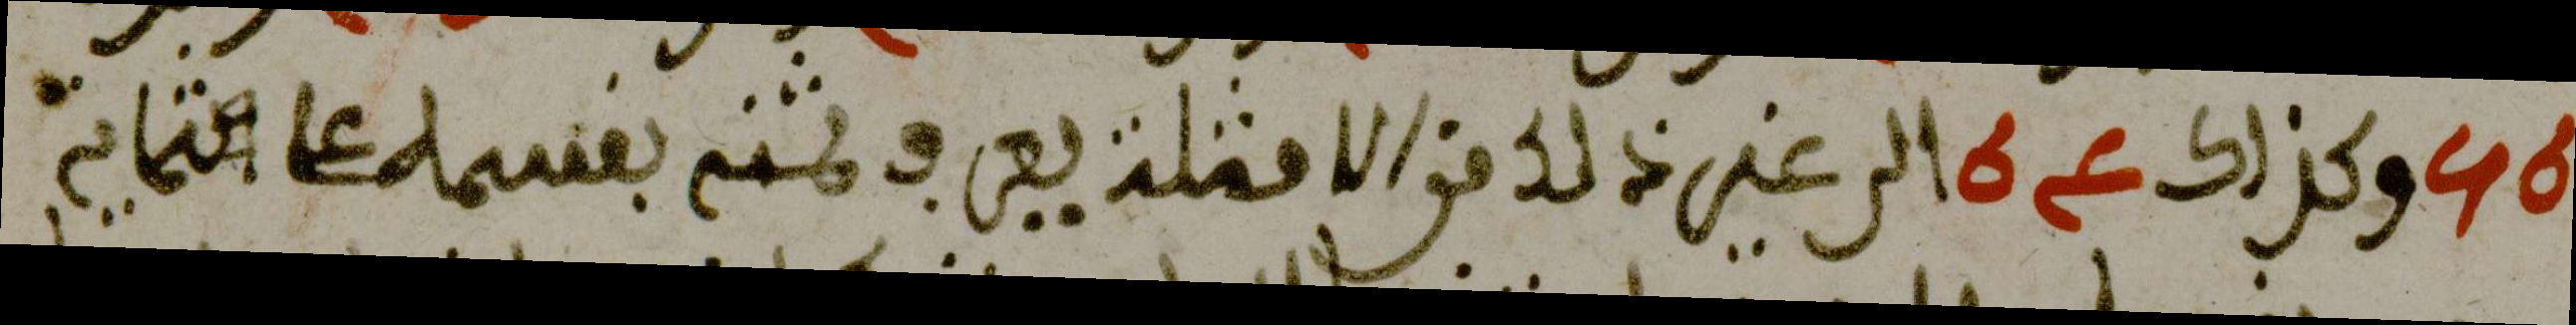56 وكذلك 64 الى غير ذلك من الأمثلة يعرف ثمنه بقسمه على الثمانية
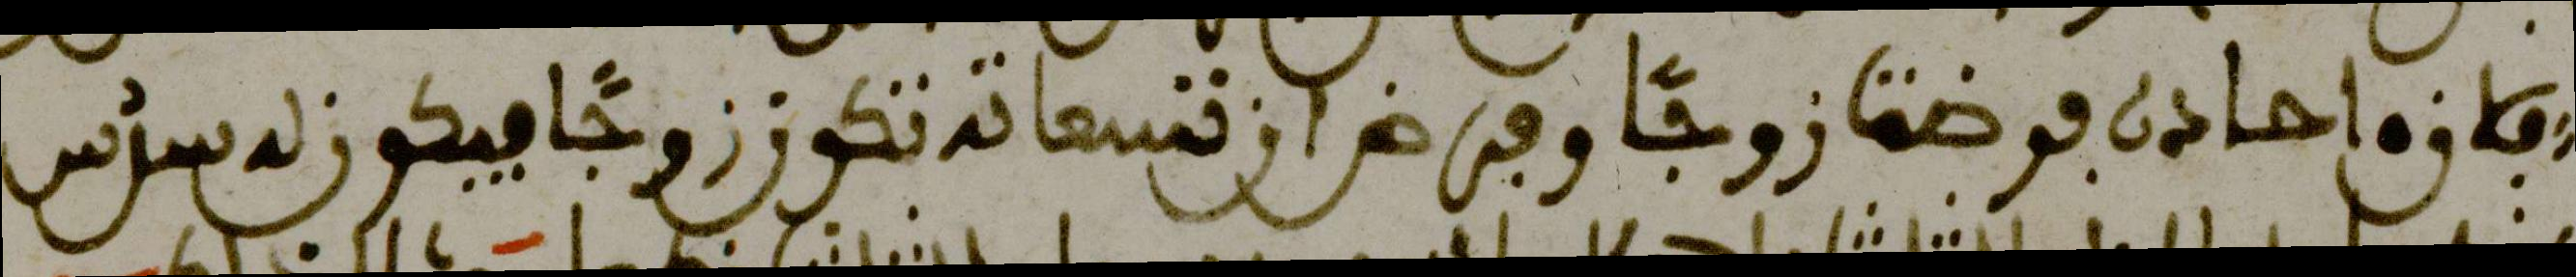فلان ءاحاده فرضت زوجًا وفرض ان تسعاته تكون زوجًا فيكون له سدس
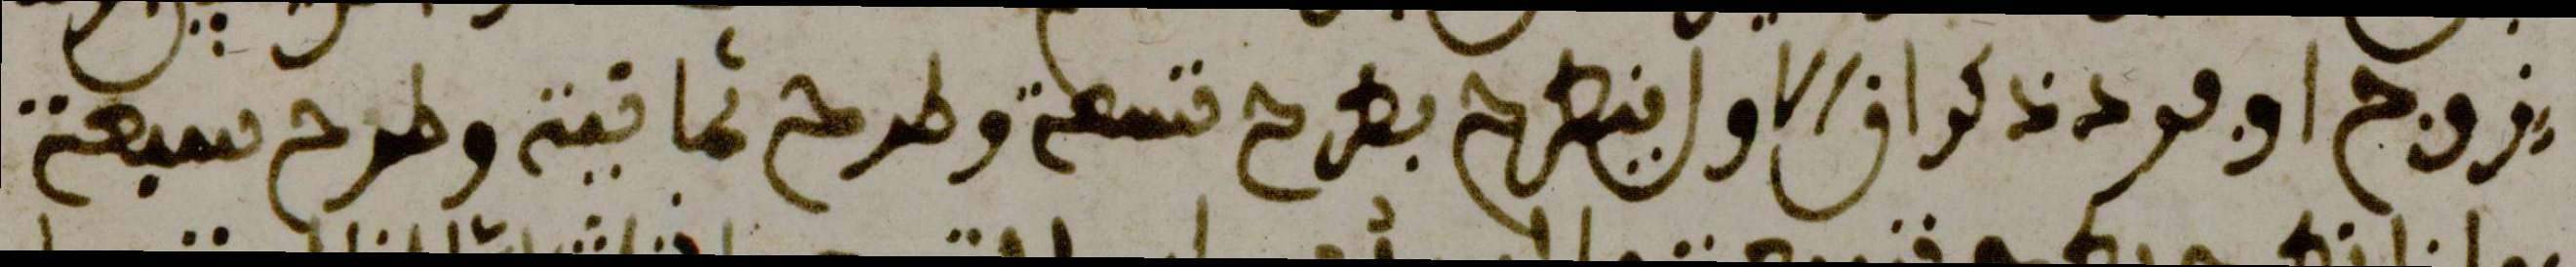زوج او فرد ذكر ان الاول فيطرح بطرح تسعة وطرح ثمانية وطرح سبعة
